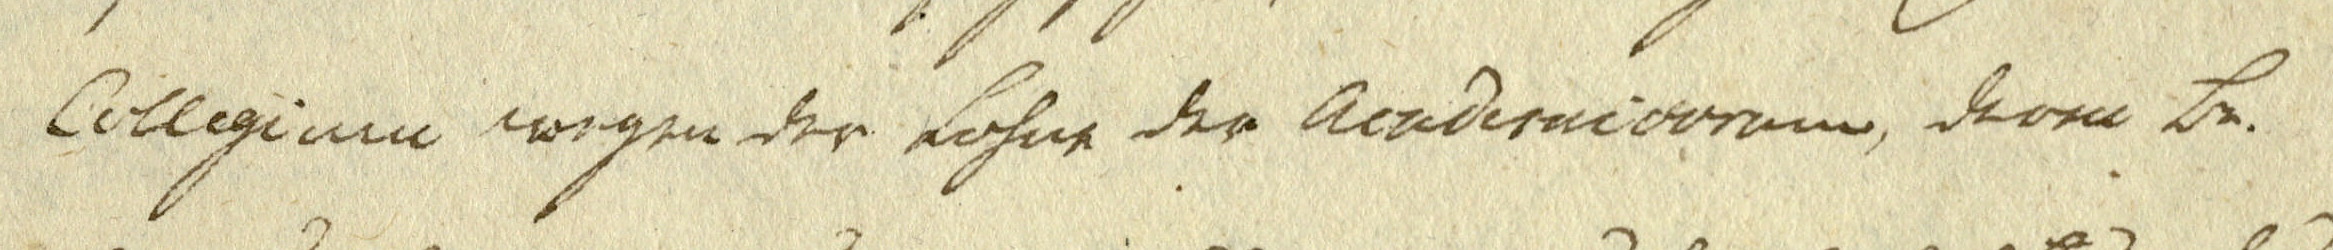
Collegium wegen der Lohne der Academicorum, deren Be¬
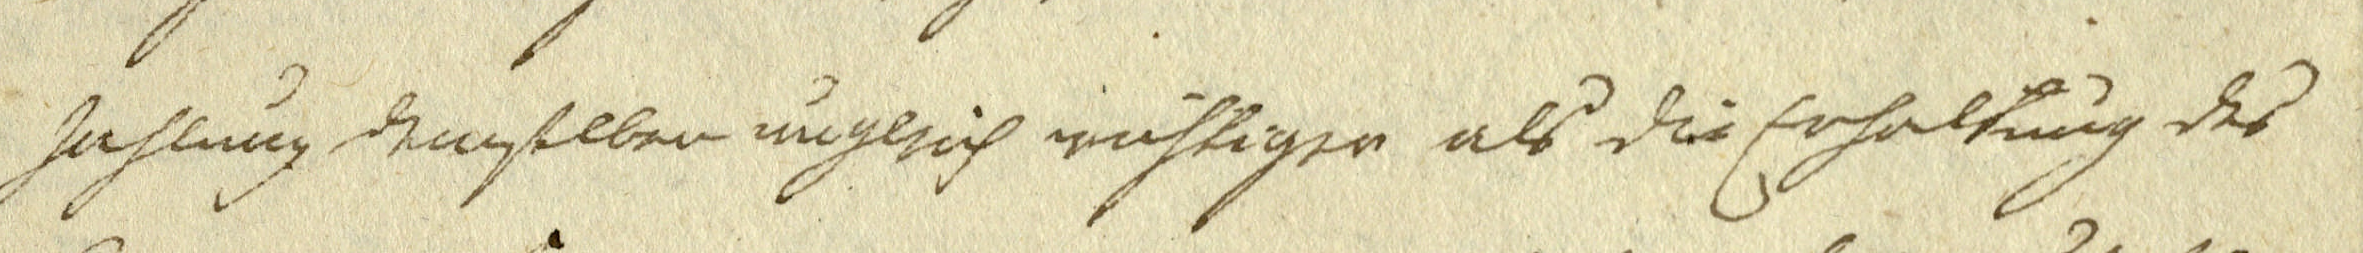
zahlung demselben ungleich wichtiger als die Erhaltung des
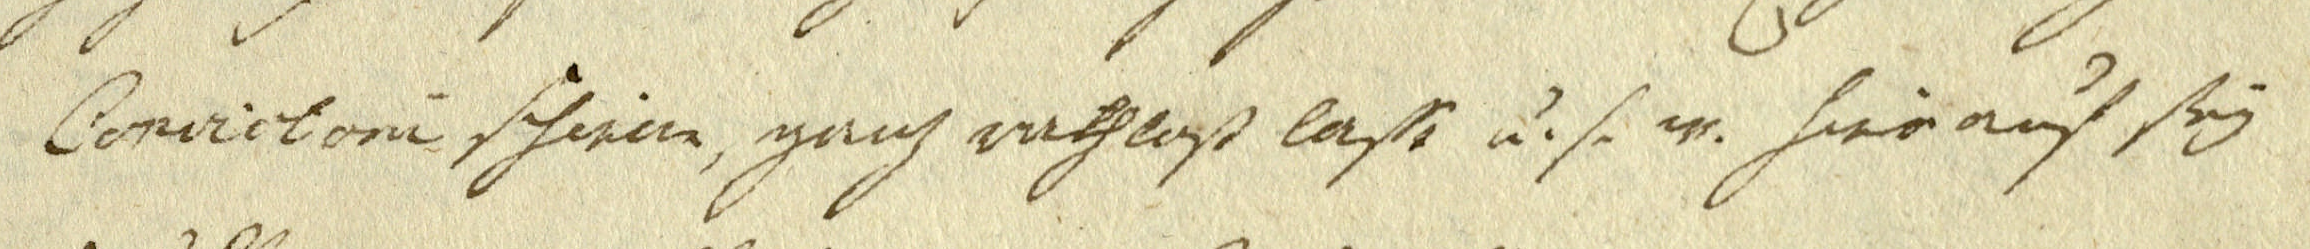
Convictorii schiene, ganz rathlos lasse u. s. w. hierauf seÿ
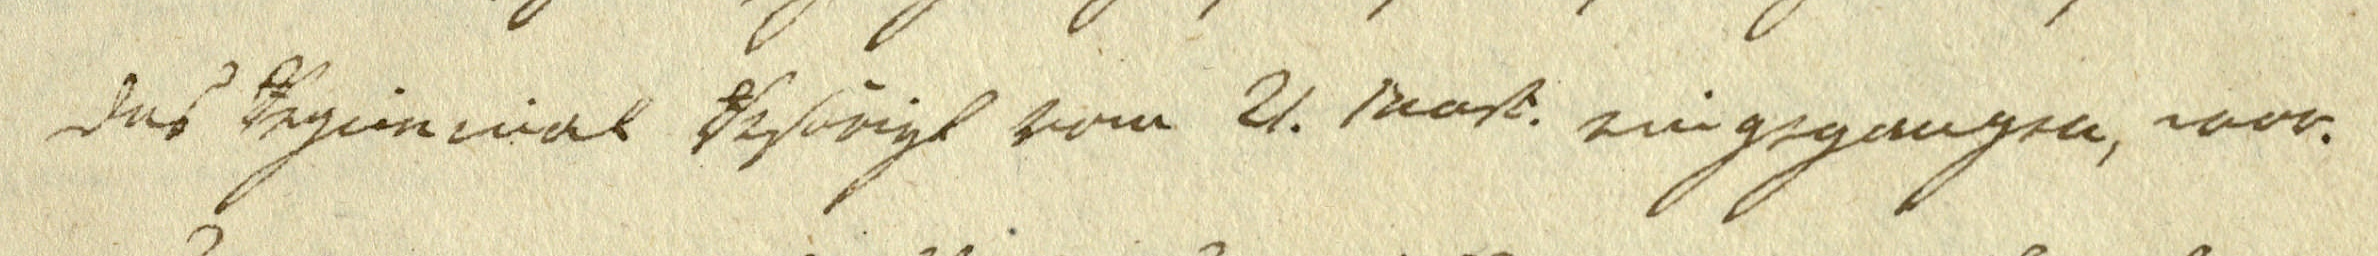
das Regiminal Rescript vom 21. Mart. eingegangen, wor¬
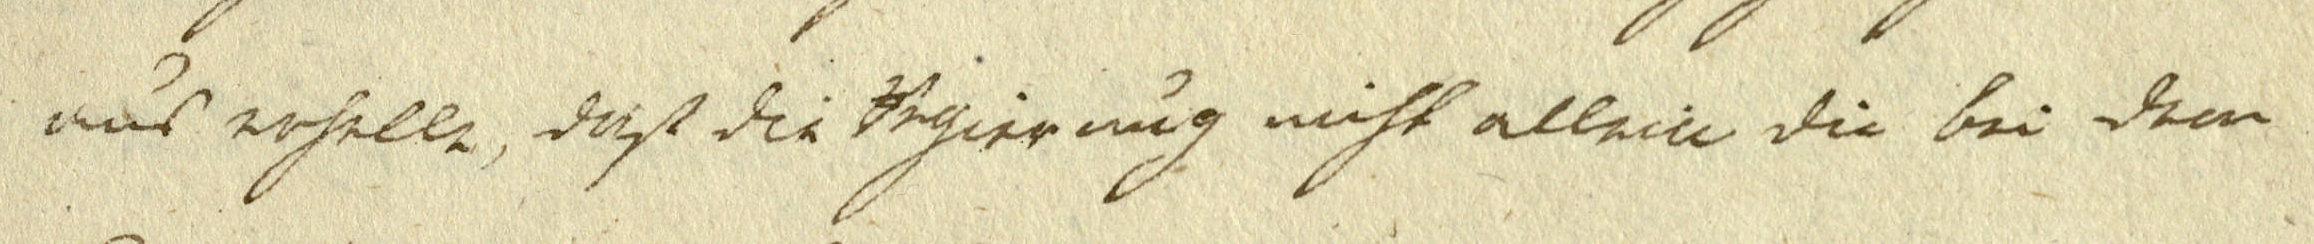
aus erhelle, daß die Regierung nicht allein die bei dem
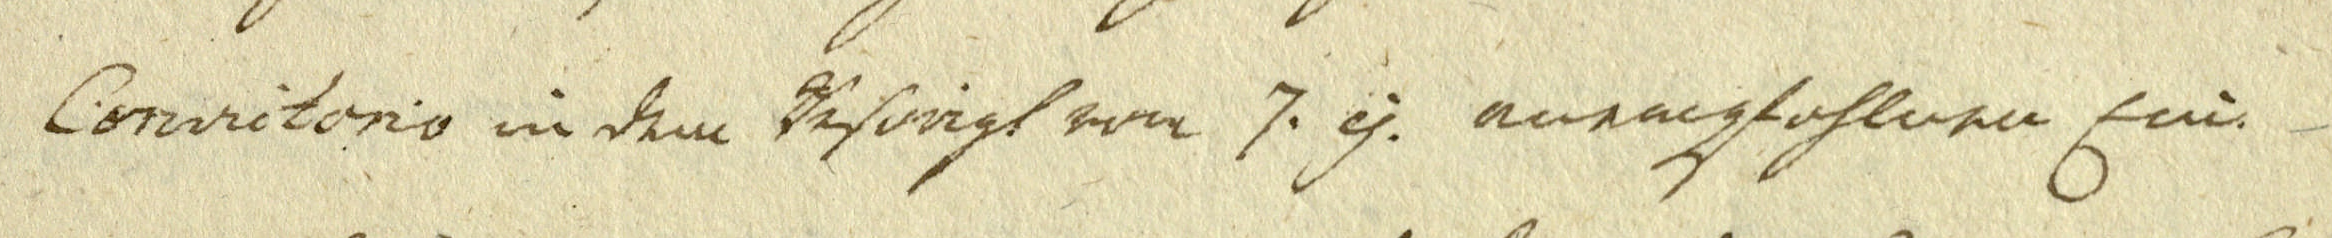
Convictorio in dem Rescript vom 7. ej. anempfohlnen Ein¬
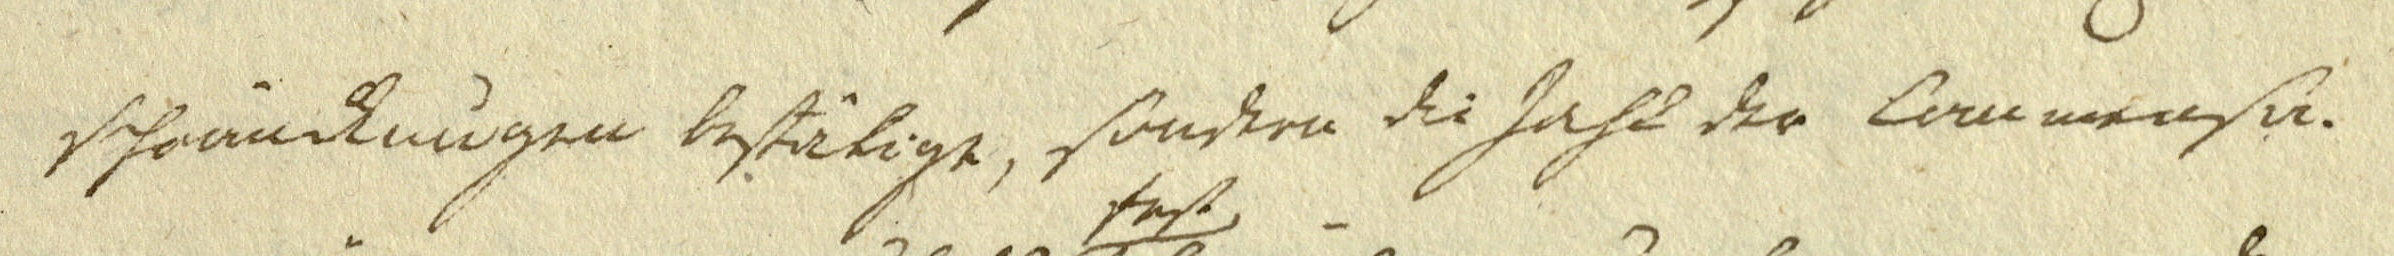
schränckungen bestätige, sondern die Wahl der Commensa¬
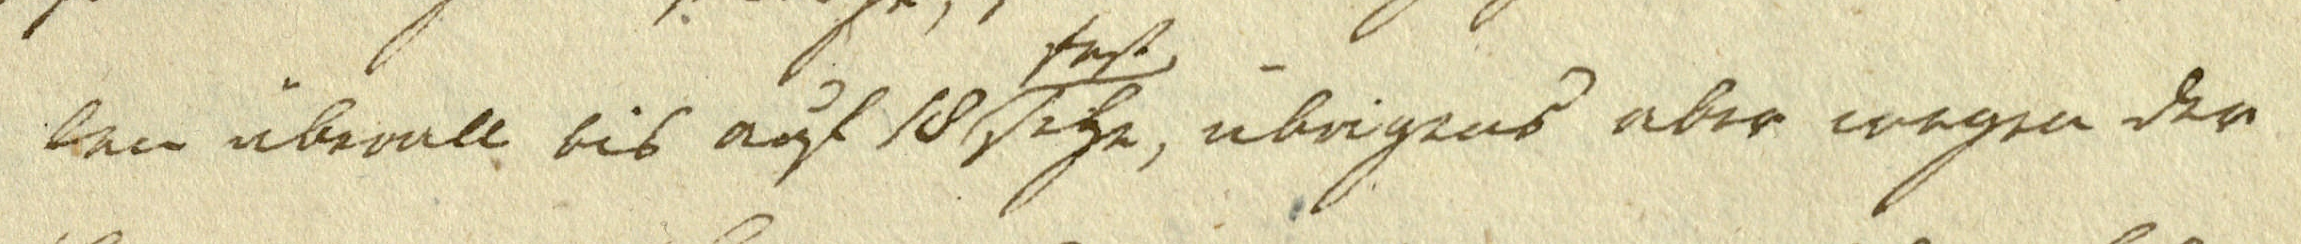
len überall bis auf 18 fest setze, übrigens aber wegen der
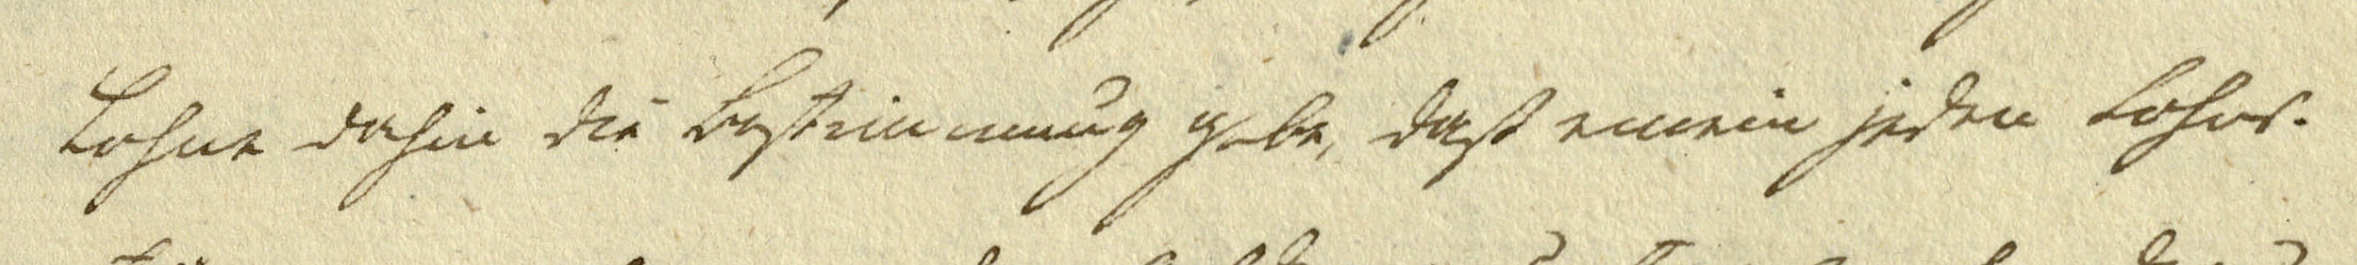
Lohne dahin die Bestimmung gebe, daß einem jeden Lohns¬
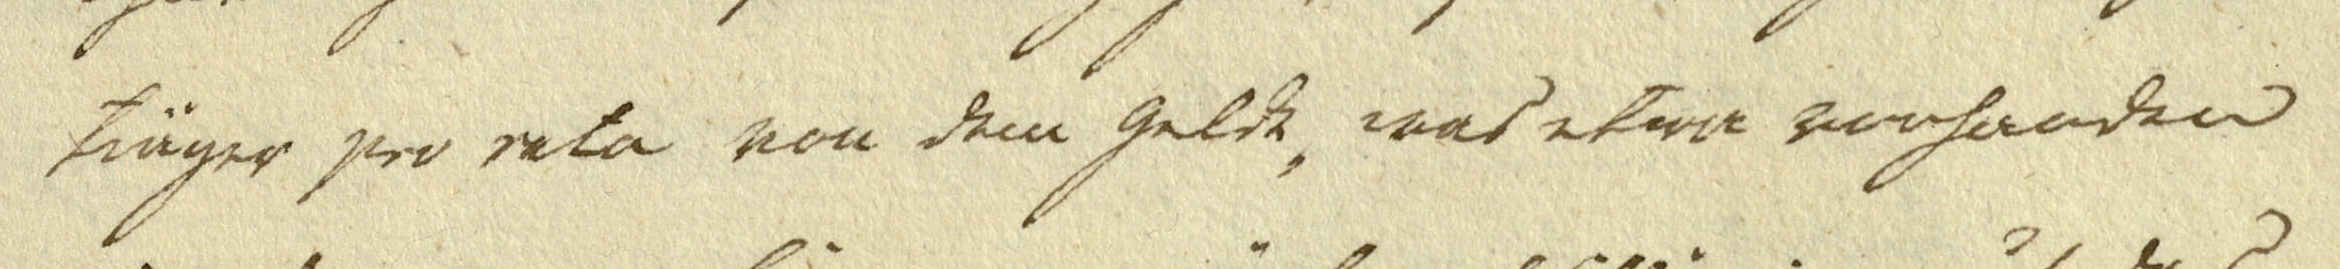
träger pro rata von dem Gelde, was etwa vorhanden
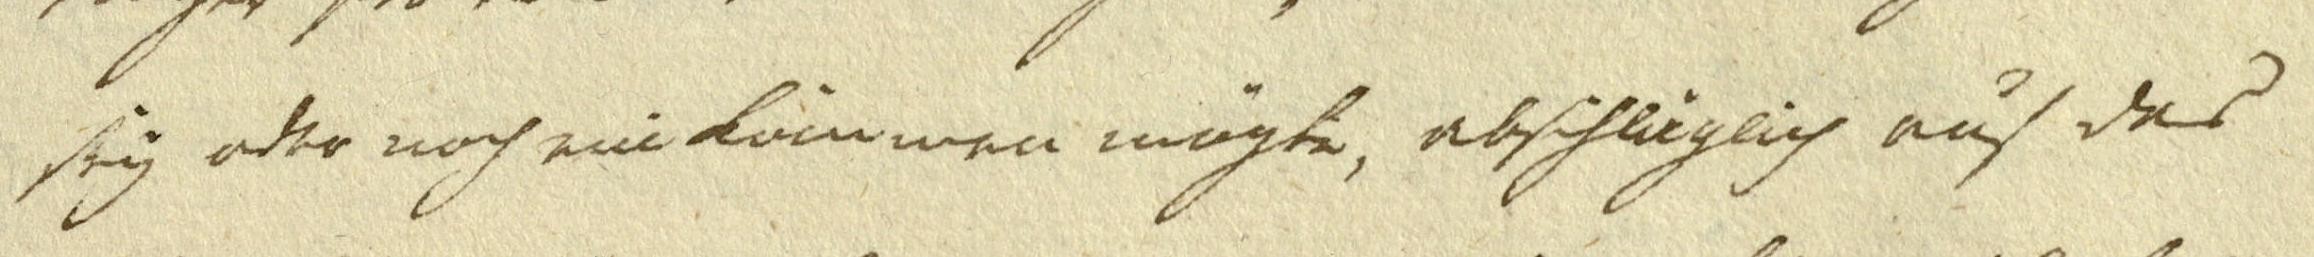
seÿ, oder noch einkommen mögte, abschläglich auf das
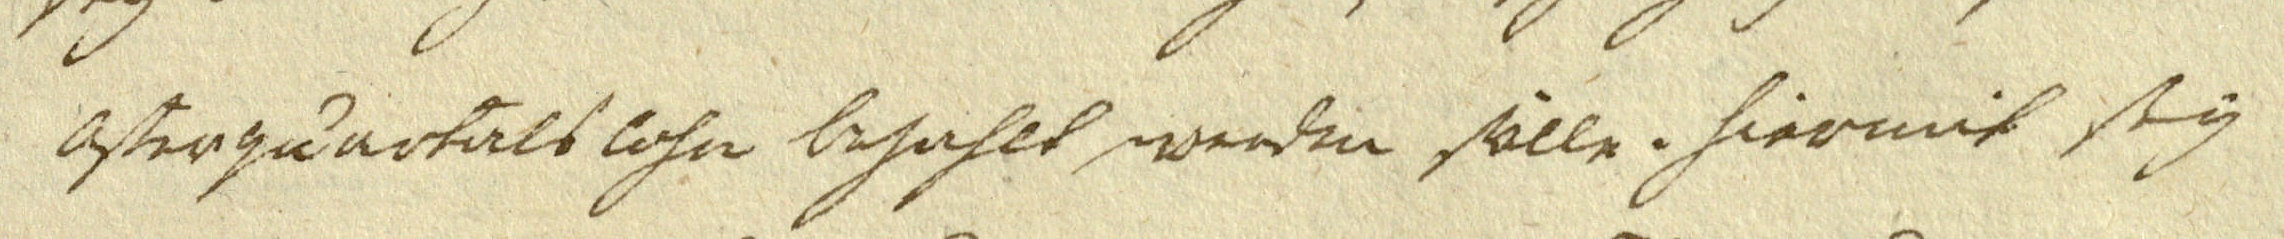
Osterquartalslohn bezahlt werden solle. Hiermit seÿ
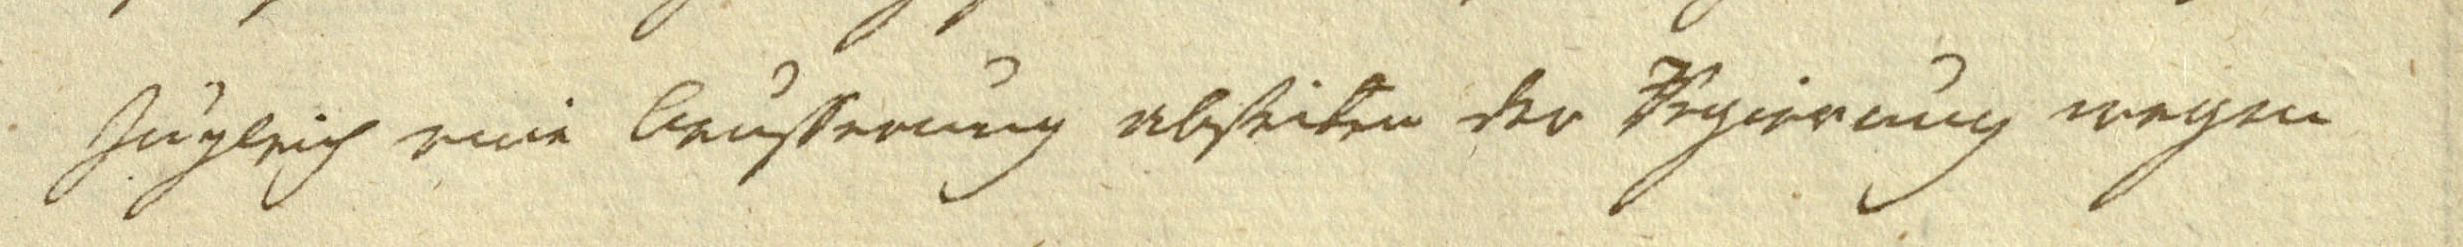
zugleich eine Aeusserung abseiten der Regierung wegen
